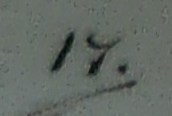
17.
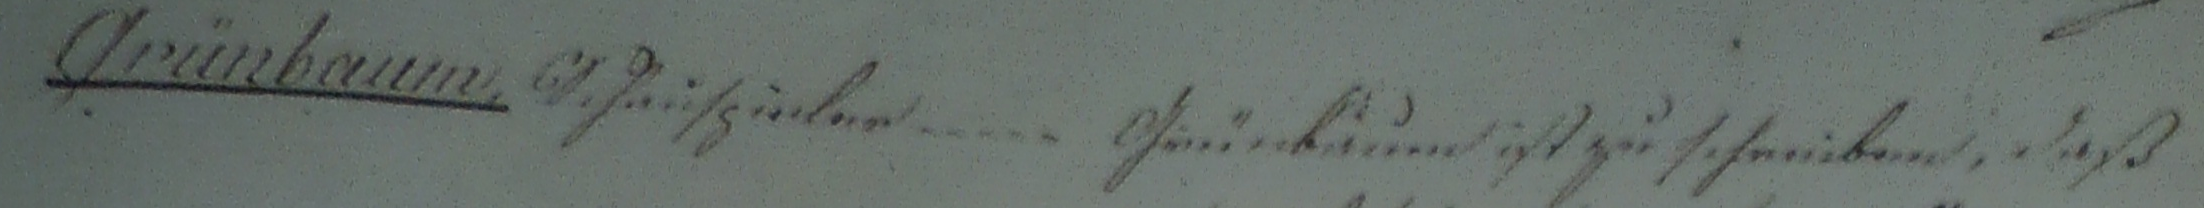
Grünbaum, Schauspieler ….. Grünbaum ist zu schreiben, daß
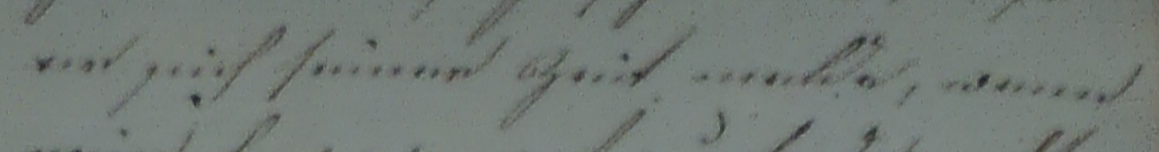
er sich seiner Zeit melde, wenn
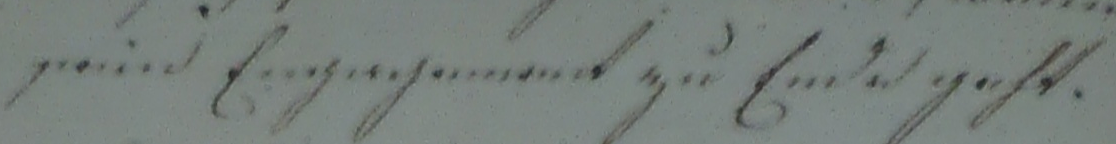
sein Engagement zu Ende geht.
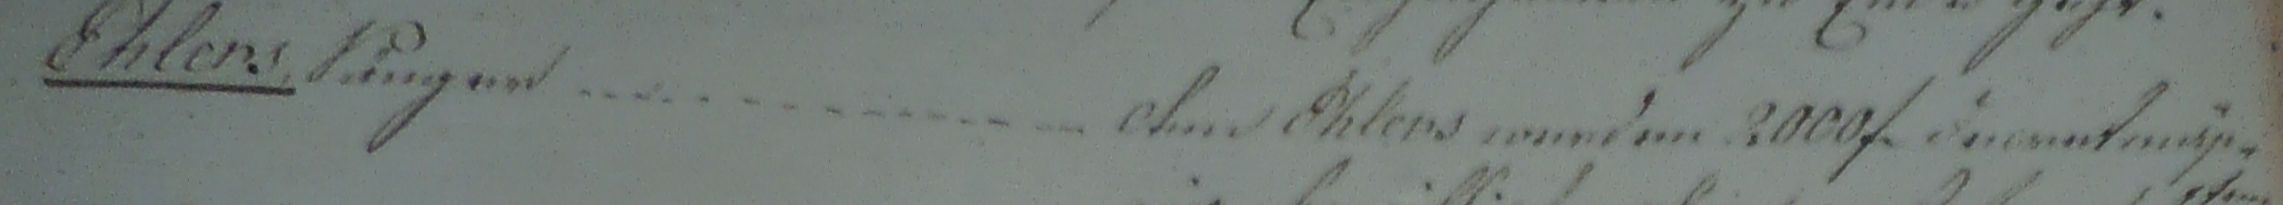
Ehlers, Sänger ………….. Dem Ehlers werden 2000fn Decretmä¬
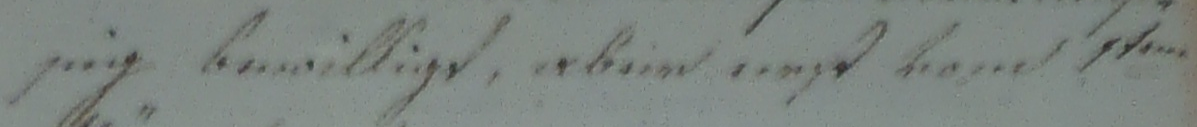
sig bewilligt, aber erst vom 1ten
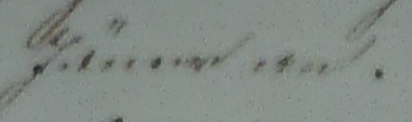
Jäner an.
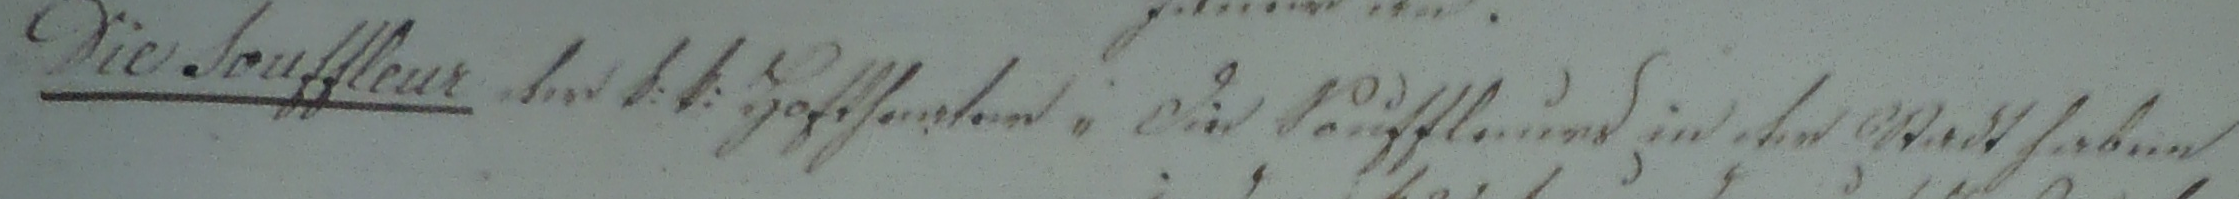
Die Souffleur der k:k: Hoftheater ,, Die Souffleurs in der Stadt haben
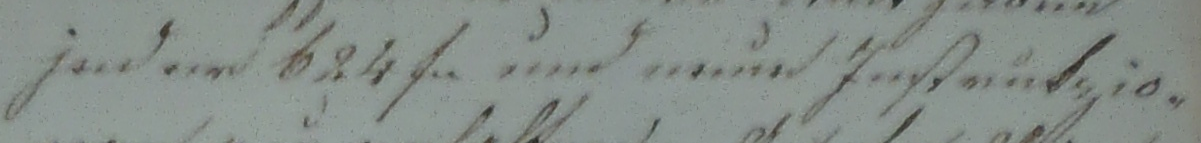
jeder 6 & 4 fn und neue Instrukzio¬
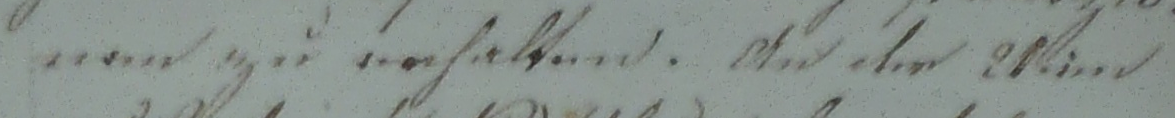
nen zu erhalten. An der Wien
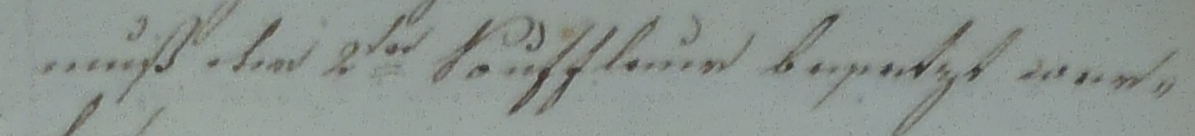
muß der 2te͇ Souffleur besetzt wer¬
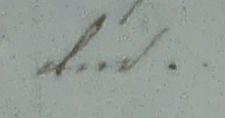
den .
